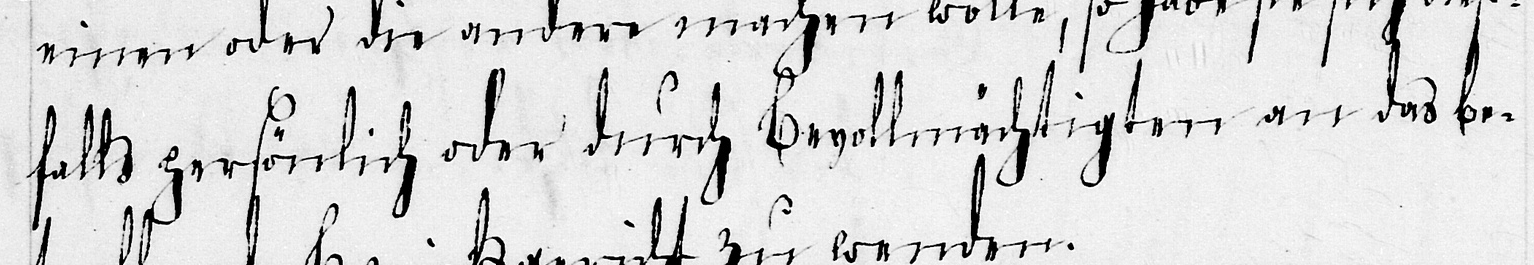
falls persönlich oder durch Bevollmächtigten an das be¬
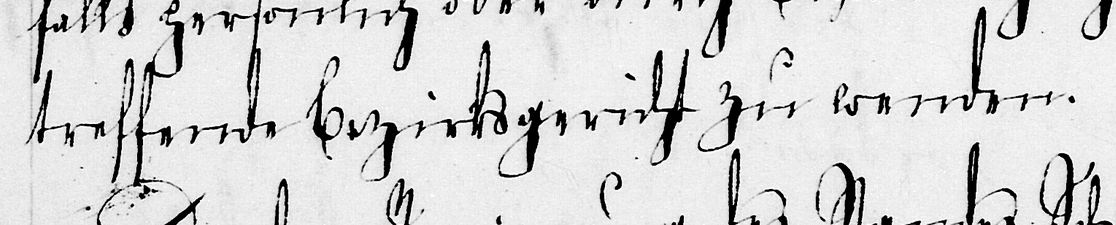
treffende Bezirksgericht zu wenden.
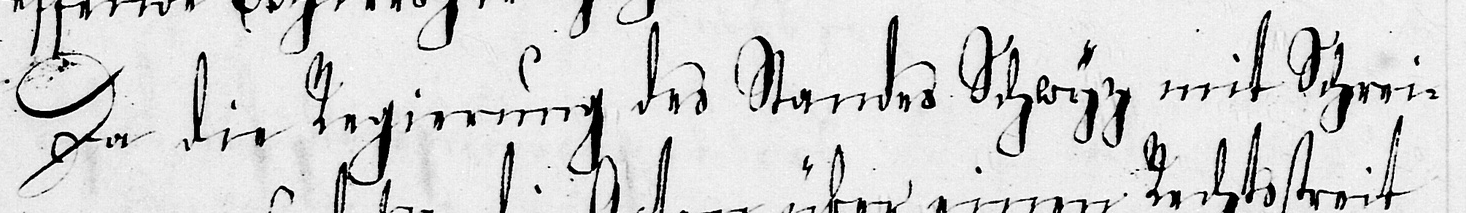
Da die Regierung des Standes Schwyz mit Schrei¬
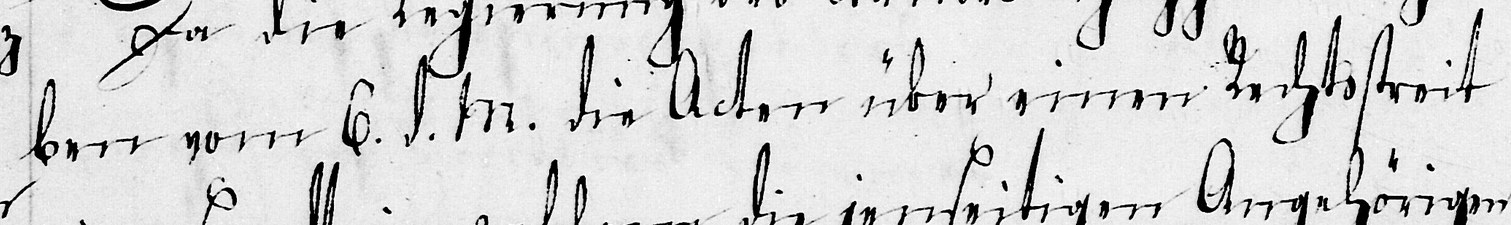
ben vom 6. d. M. die Acten über einen Rechtsstreit
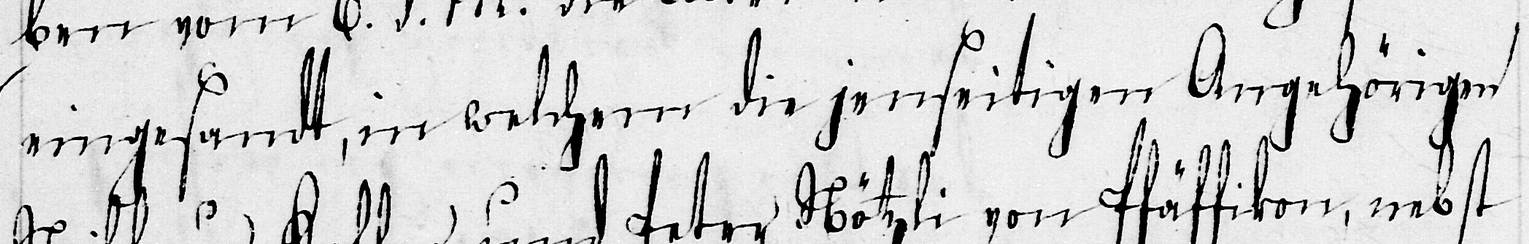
eingesandt, in welchem die jenseitigen Angehörigen
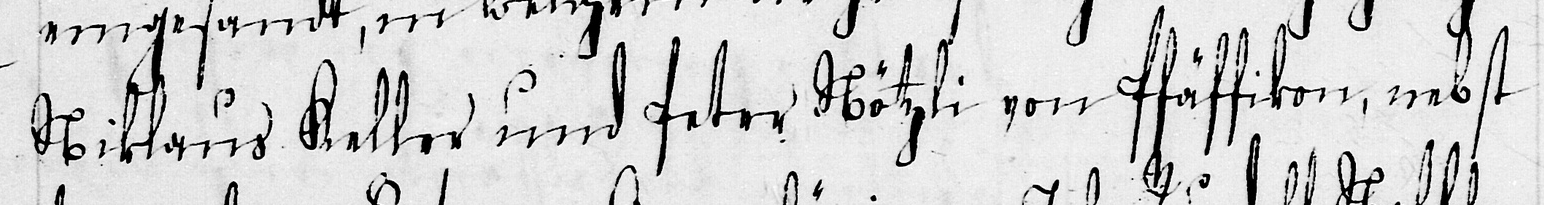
Niklaus Keller und Peter Nötzli von Pfäffikon, nebst
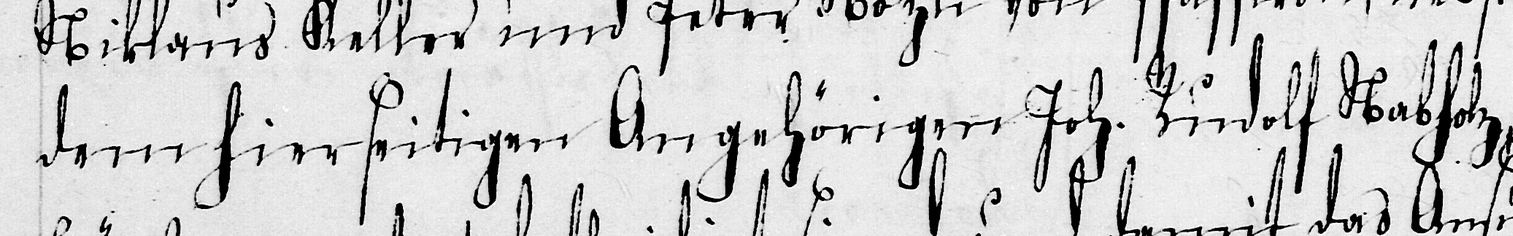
dem hierseitigen Angehörigen Joh. Rudolf Nabhol¬
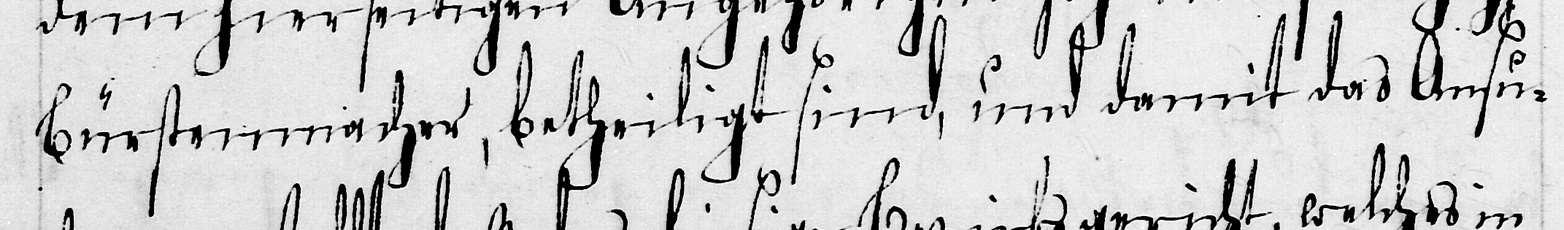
Bürstenmacher, betheiligt sind, und damit das Ansu¬
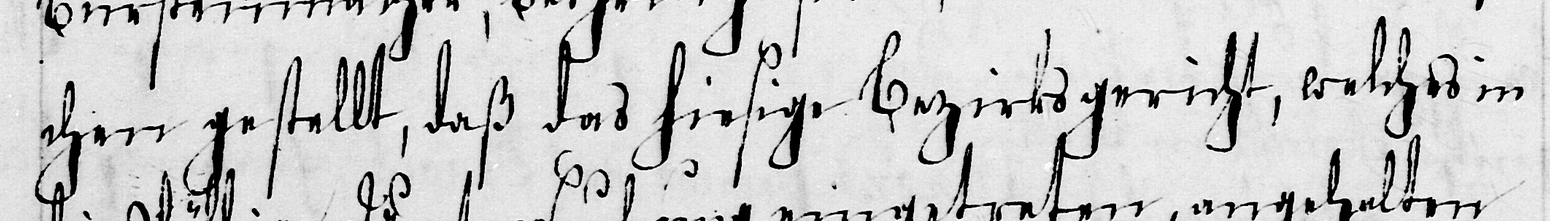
chen gestellt, daß das hiesige Bezirksgericht, welches in
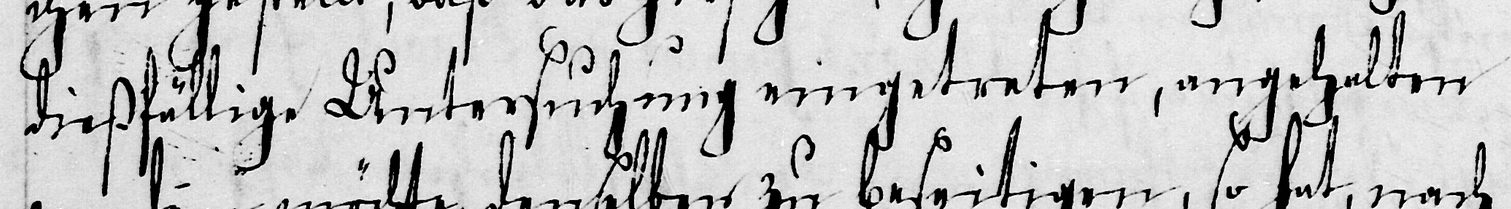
dießfällige Untersuchung eingetreten, angehalten
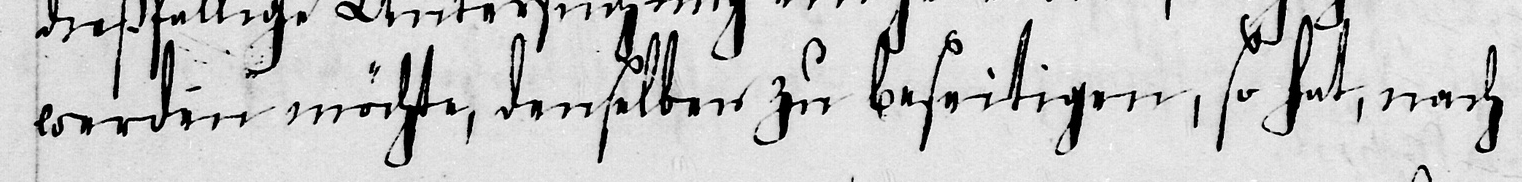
werden möchte, denselben zu beseitigen, so hat, nach
